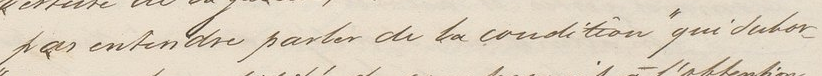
pas entendre parler de la condition «qui subor-
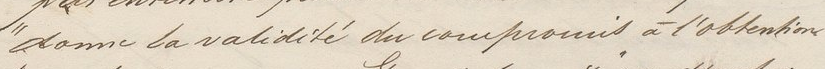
donne la validité du compromis à l'obtention
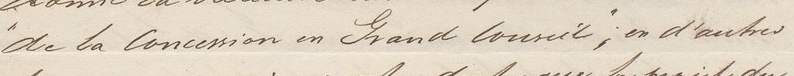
de la Concession en Grand Conseil», en d'autres
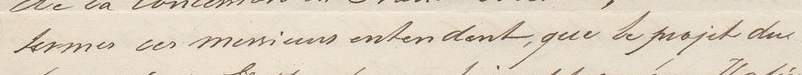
termes ces messieurs entendent, que le projet du
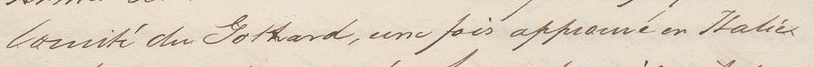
Comité du Gothard, une fois approuvé en Italie
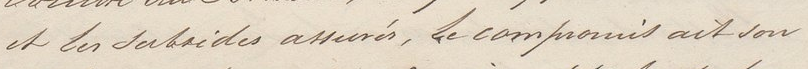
et les subsides assurés, le compromis ait son
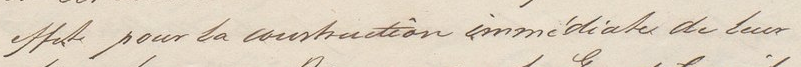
effet pour la construction immédiate de leur
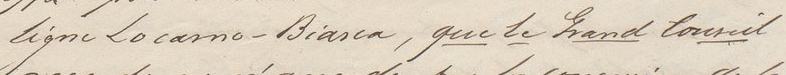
ligne Locarno–Biasca, queleGrandConseil
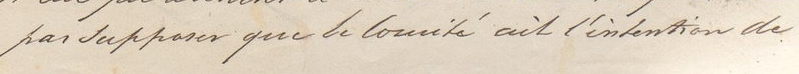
pas supposer que le Comité ait l'intention de
